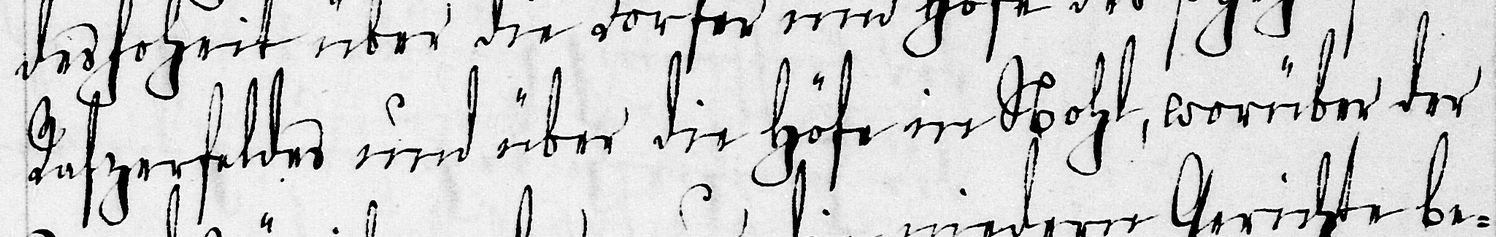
Rafzerfeldes und über die Höfe in Nohl, worüber der
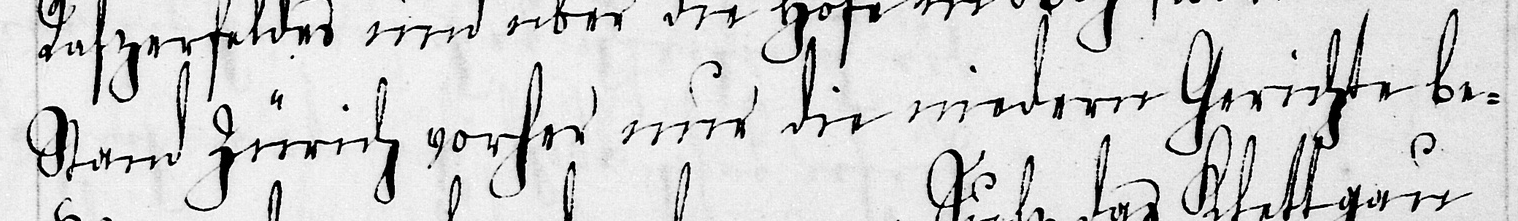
Stand Zürich vorher nur die niedern Gerichte be¬
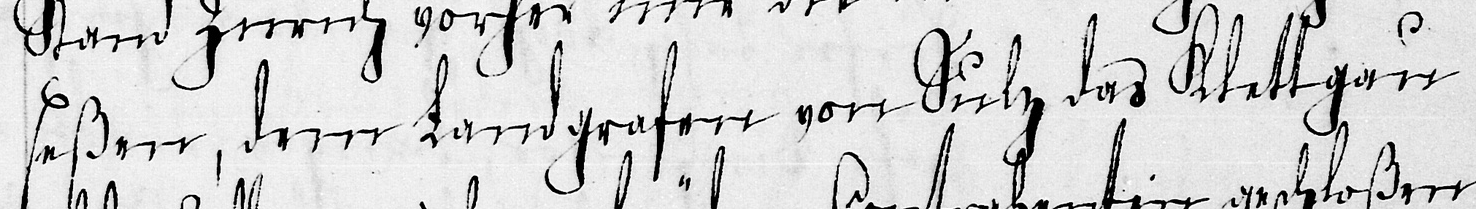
seßen, dem Landgrafen von Sulz das Klettgau
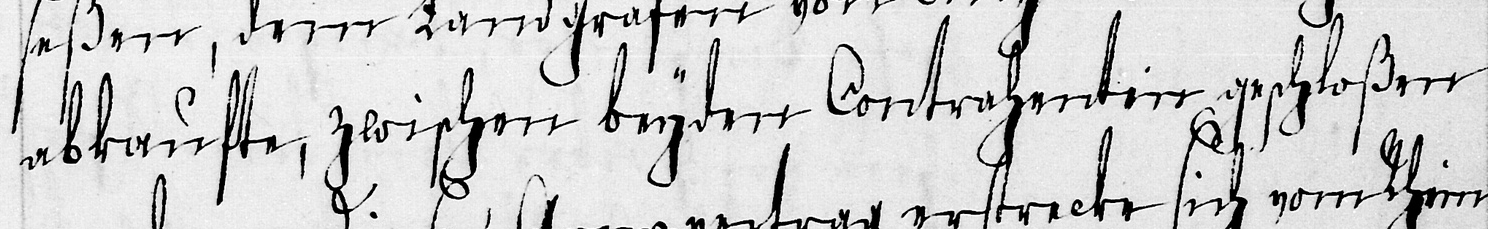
abkaufte, zwischen beyden Contrahenten geschloßen
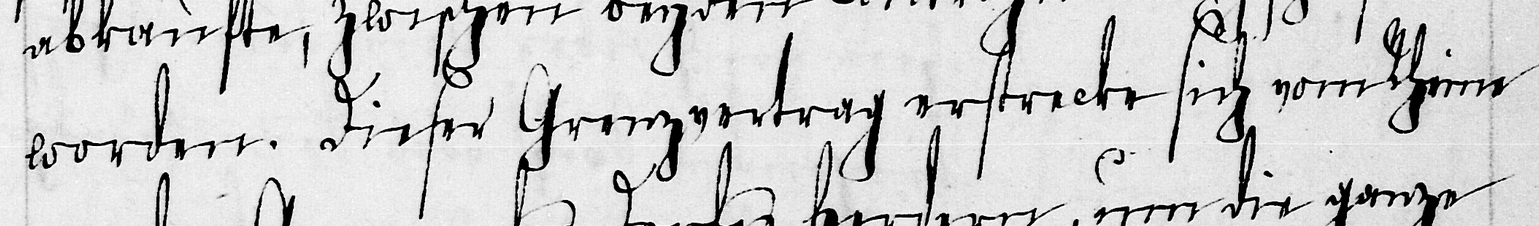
worden. Dieser Grenzvertrag erstrecke sich vom Rheine
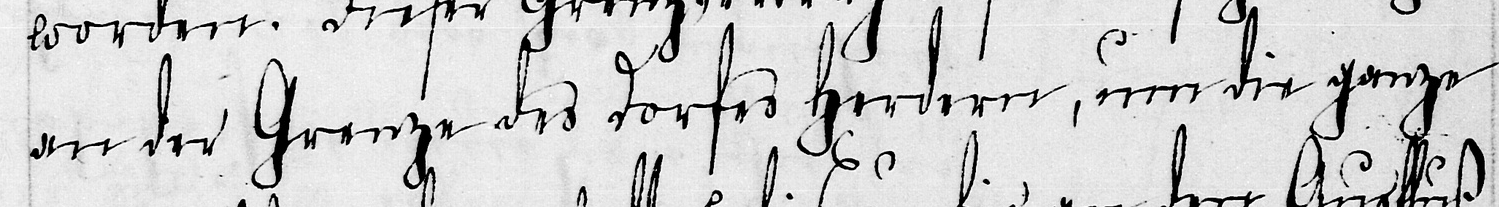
an der Grenze des Dorfes Herdern, um die ganze
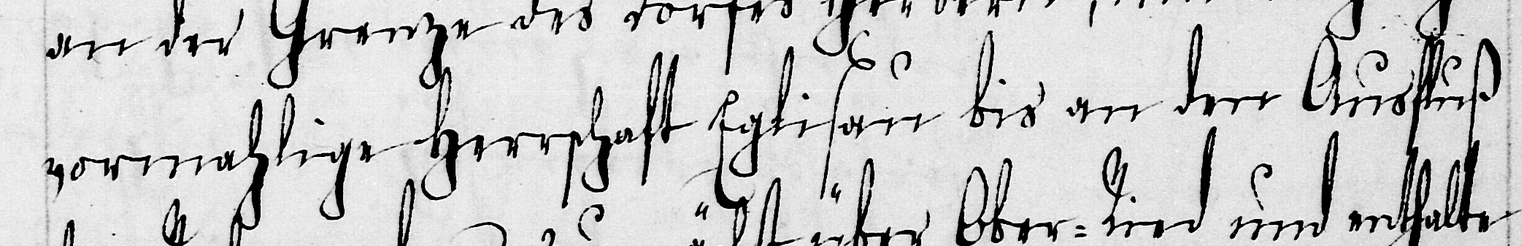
vormahlige Herrschaft Eglisau bis an den Ausfluß
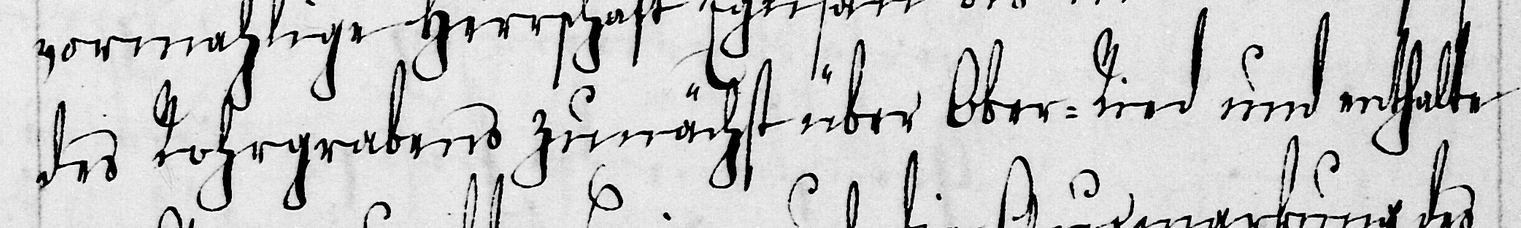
des Rohrgrabens zunächst über Ober-Ried und enthalte
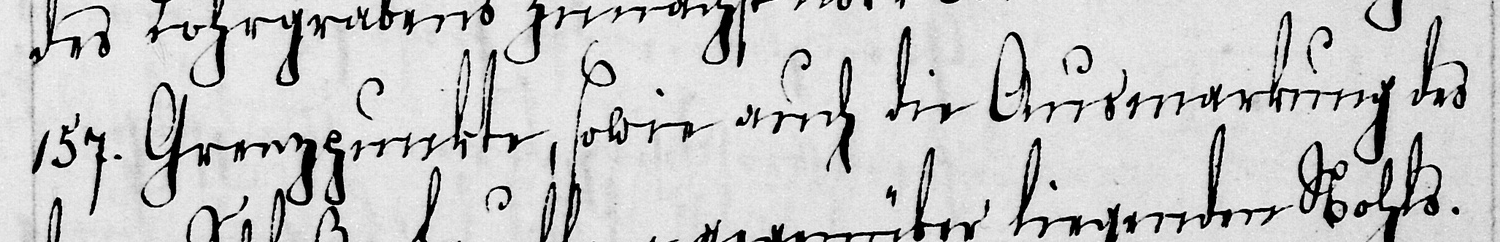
157. Grenzpunkte, sowie auch die Ausmarkung des
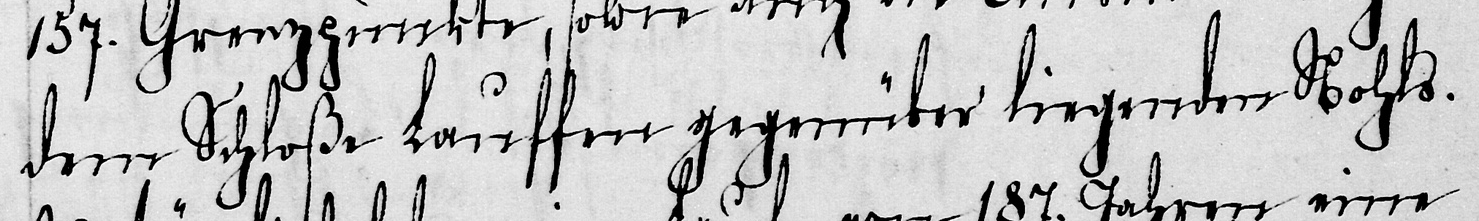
dem Schloße Lauffen gegenüber liegenden Nohls.
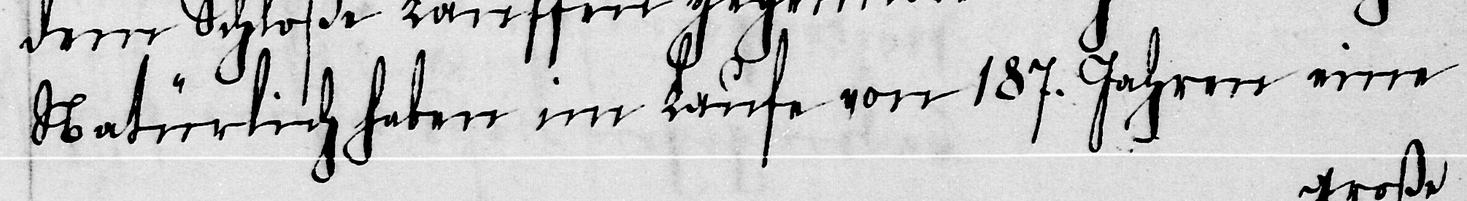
Natürlich haben im Laufe von 187. Jahren eine
